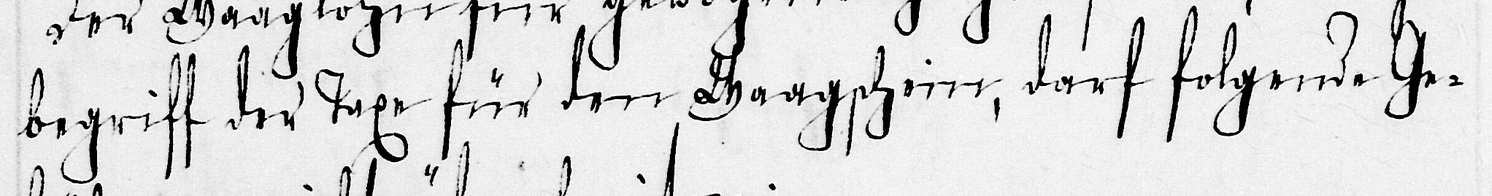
begriff der Taxe für den Waagschein, darf folgende Ge¬
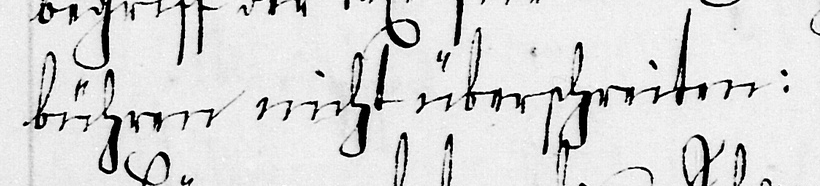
bühren nicht überschreiten:
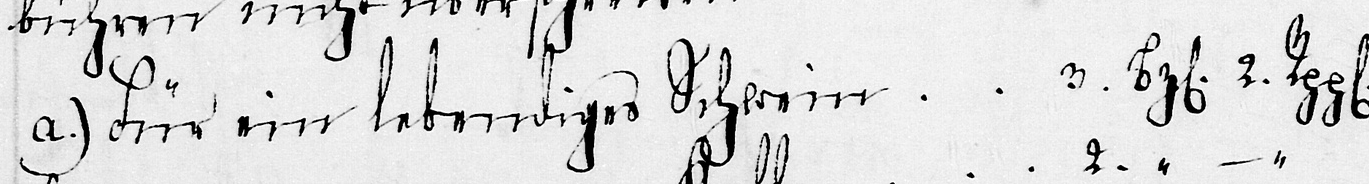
a.) Für ein lebendiges Schwein 3. Bz[en]. 2.
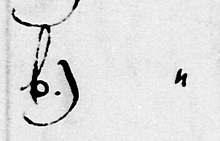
b.)
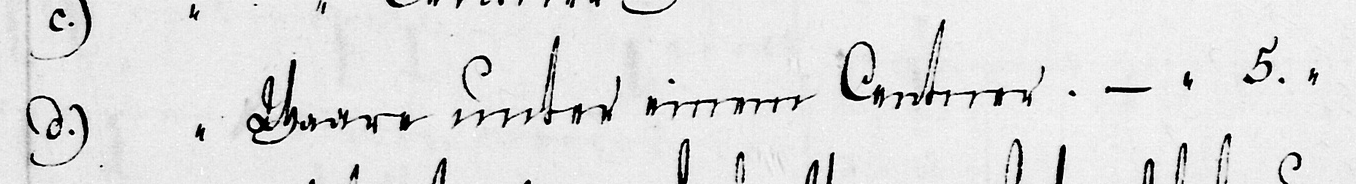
d.) “ Waare unter einem Centner – “ 5. “
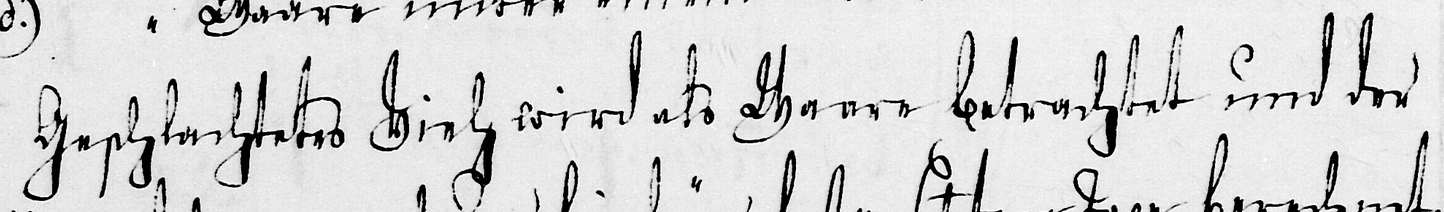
Geschlachtetes Vieh wird als Waare betrachtet und der
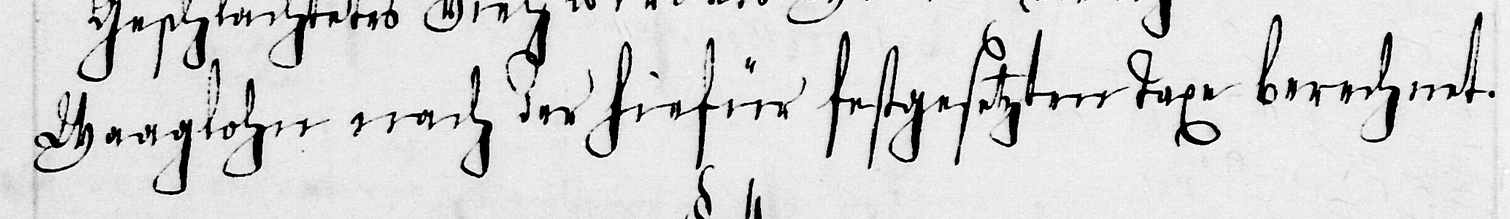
Waaglohn nach der hiefür festgesetzten Taxe berechnet.
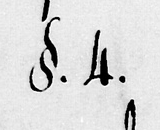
§. 4.
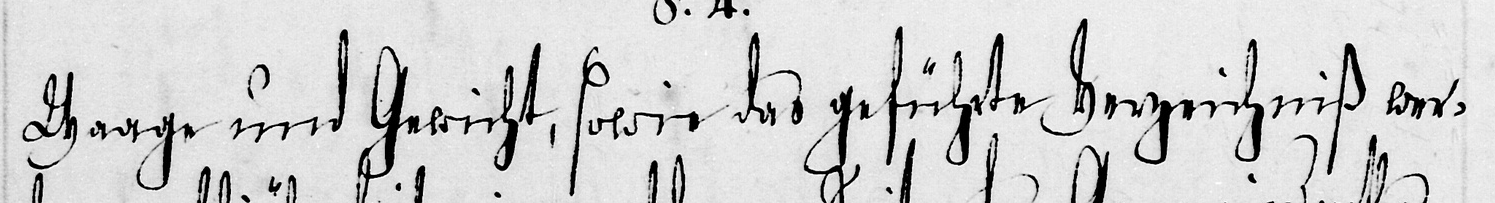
Waage und Gewicht, sowie das geführte Verzeichniß wer¬
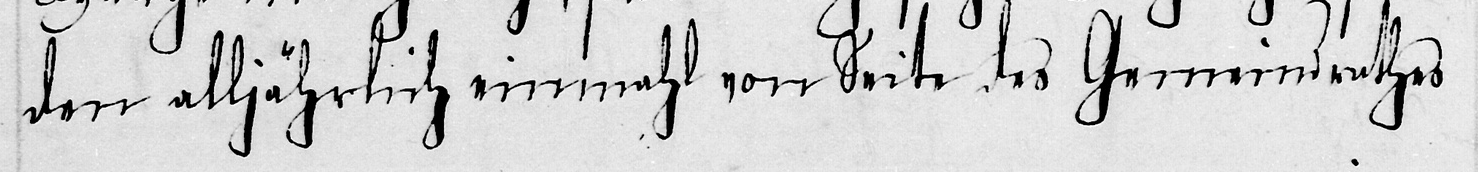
den alljährlich einmahl von Seite des Gemeindrathes
